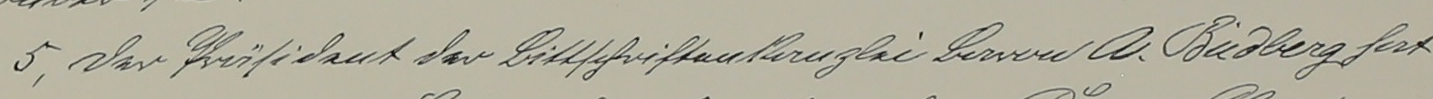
5. Der Präsident der Bittschriftenkanzlei Baron A. Budberg hat
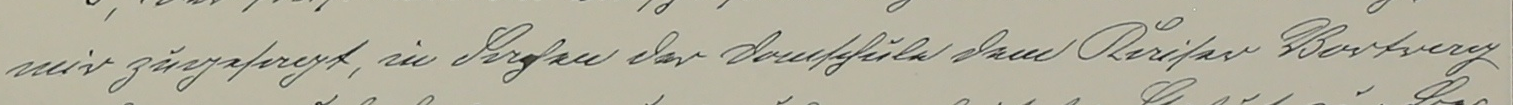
mir zugesagt, in Sachen der Domschule dem Kaiser Vortrag
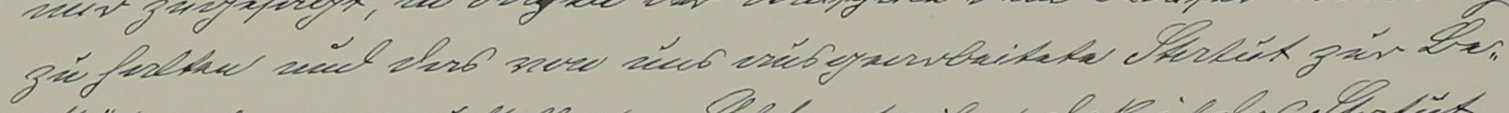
zu halten und das von uns ausgearbeitete Statut zur Be-
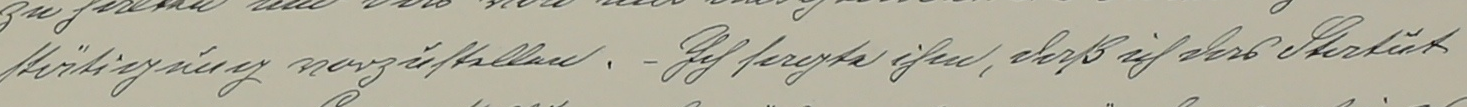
stätigung vorzustellen. - Ich sagte ihm, daß ich das Statut
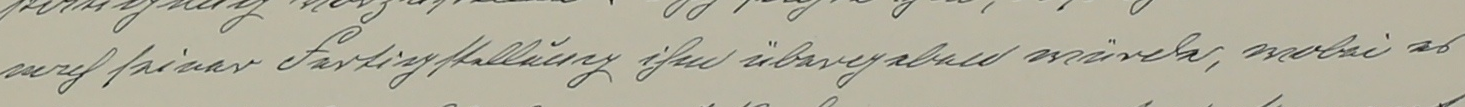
nach seiner Fertigstellung ihm übergeben würde, wobei es
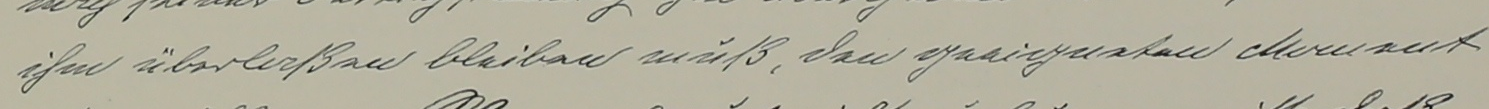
ihm überlaßen bleiben muß, den geeigneten Moment
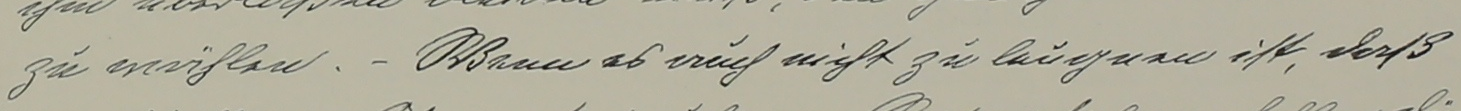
zu wählen. - Wenn es auch nicht zu leugnen ist, daß
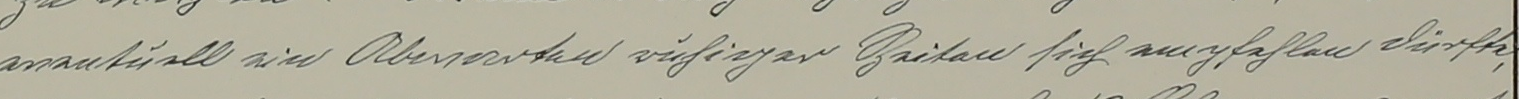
eventuell ein Abwarten ruhiger Zeiten sich empfehlen dürfte,
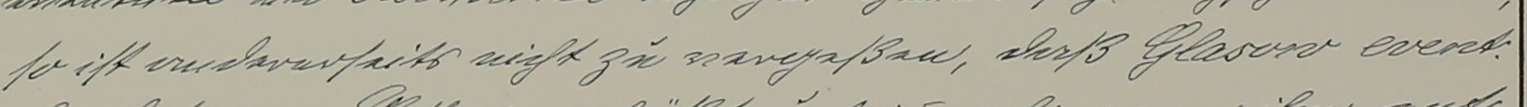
so ist andererseits nicht zu vergeßen, daß Glasow event-
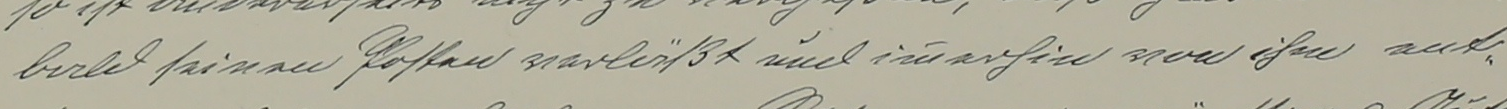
bald seinen Posten verläßt und immerhin von ihm ent-
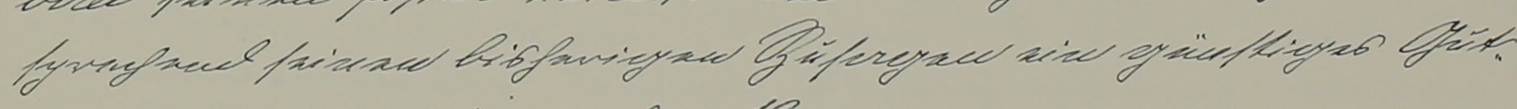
sprechend seinen bisherigen Zusagen ein günstiges Gut-
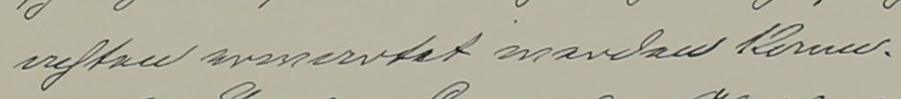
achten erwartet werden kann.
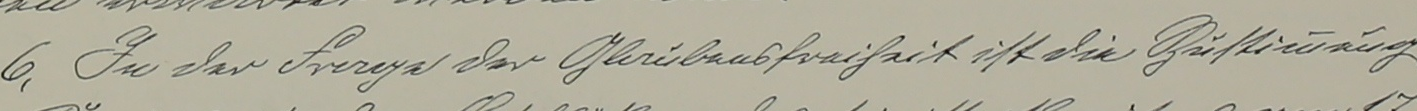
6. In der Frage der Glaubensfreiheit ist die Zustimmung
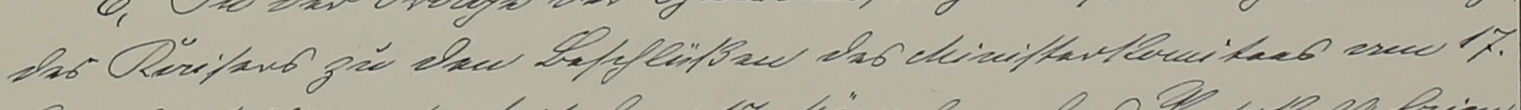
des Kaisers zu den Beschlüßen des Ministerkomitees am 17.
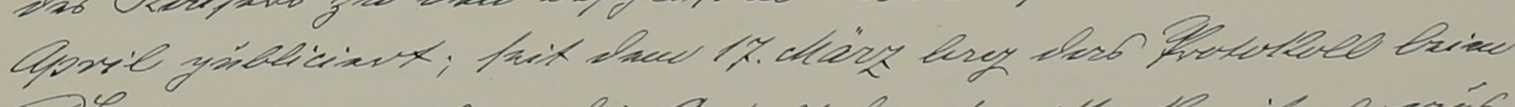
April publiciert; seit dem 17. März lag das Protokoll beim
